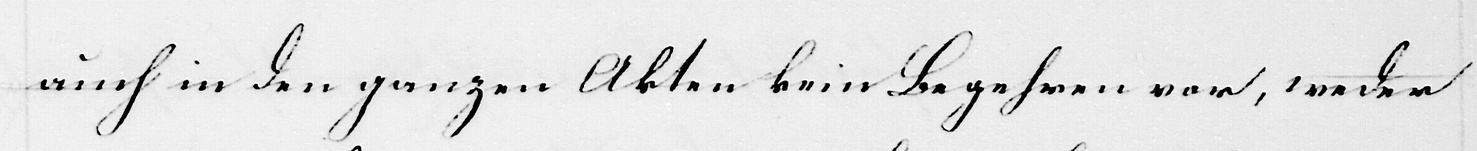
auch in den ganzen Akten kein Begehren vor, weder
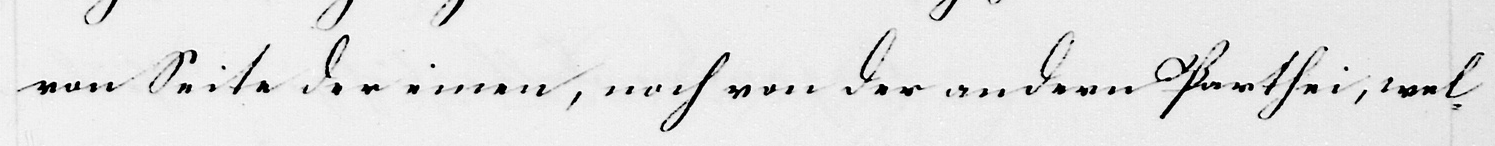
von Seite der einen, noch von der andern Parthei, wel¬
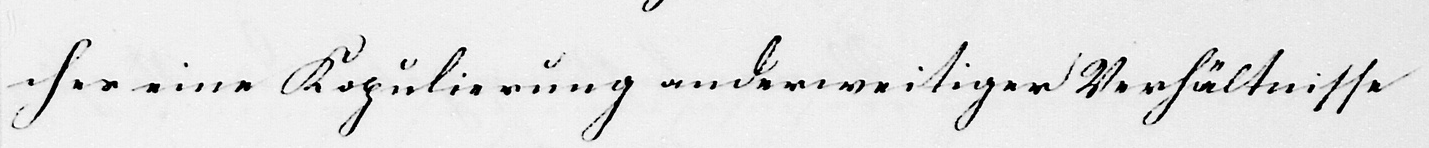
ches eine Kopulierung anderweitiger Verhältnisse
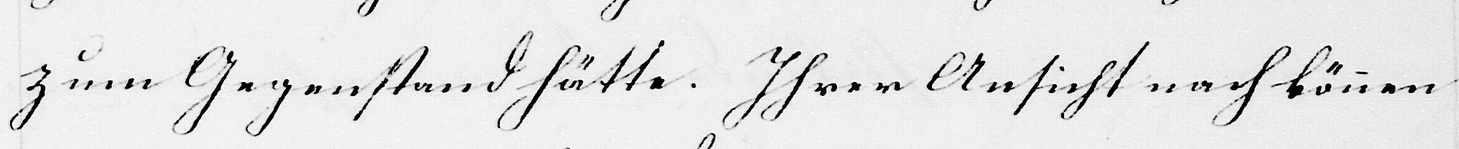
zum Gegenstand hätte. Ihrer Ansicht nach können
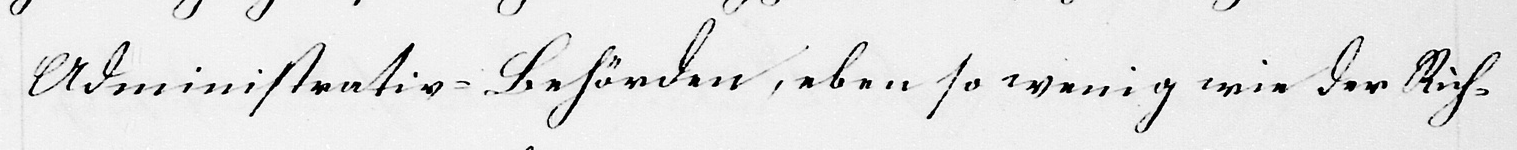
Administrativ-Behörden, eben so wenig wie der Rich¬
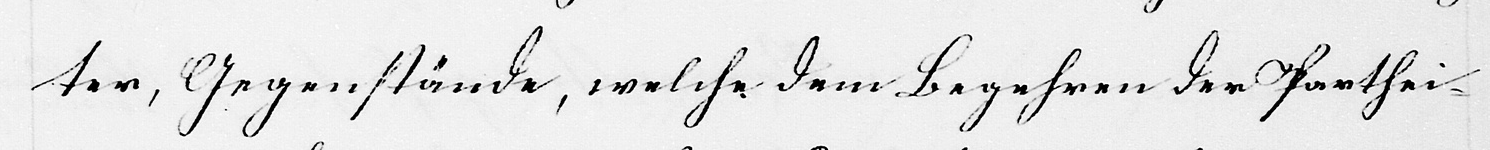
ter, Gegenstände, welche dem Begehren der Parthei¬
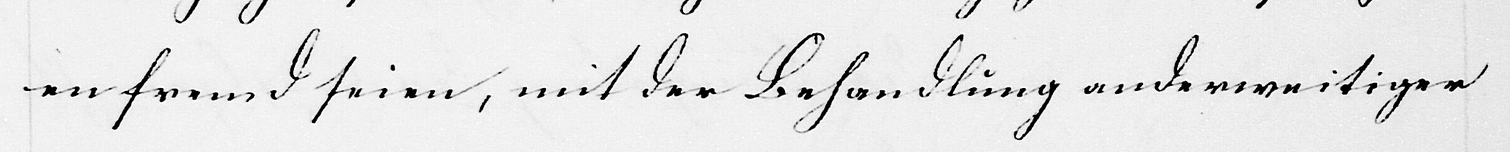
en fremd seien, mit der Behandlung anderweitiger
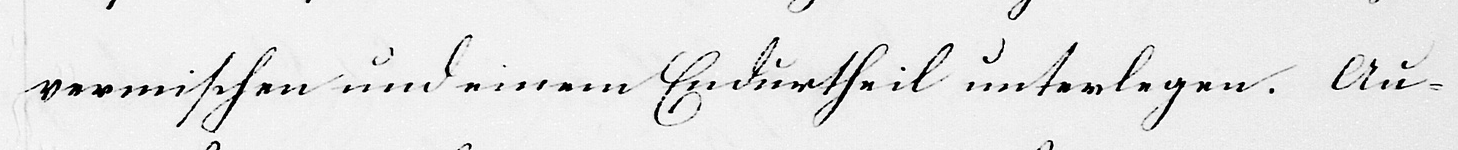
vermischen und einem Endurtheil unterlegen. Au¬
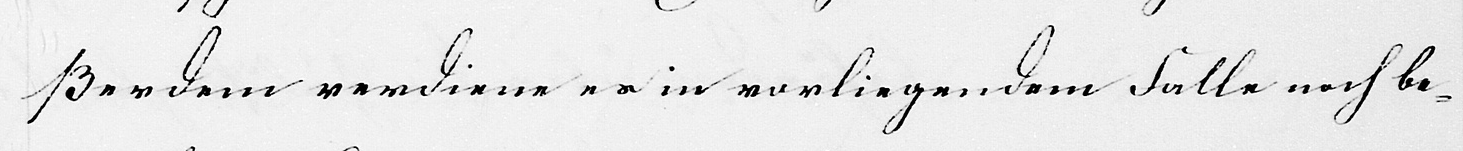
ßerdem verdiene es in vorliegendem Falle auch be¬
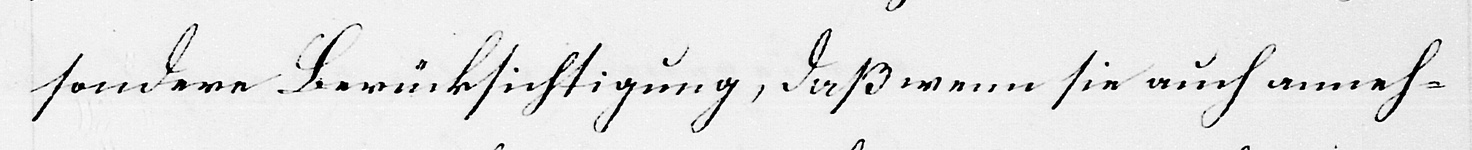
sondere Berücksichtigung, daß wenn sie auch anneh¬
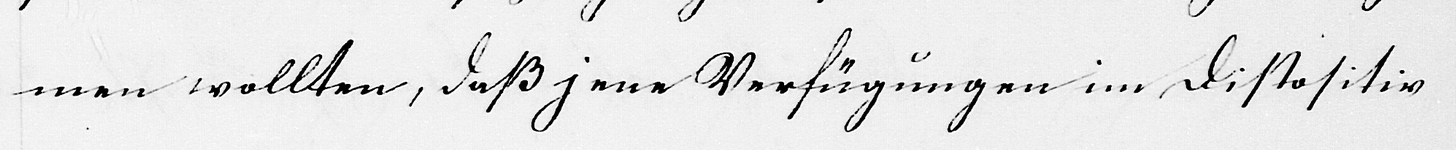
men wollten, daß jene Verfügungen im Dispositiv
